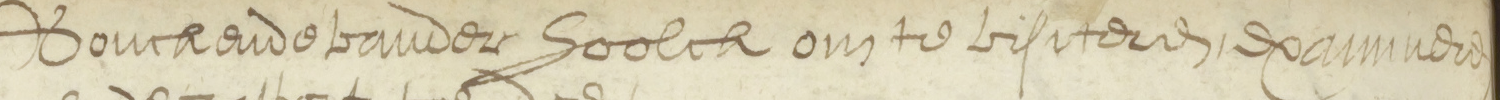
Sonck ende vander Hoolck om te visiteren, examineren
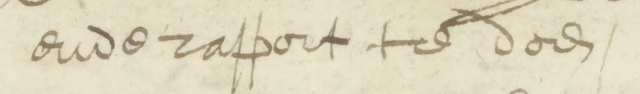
ende rapport te doen.
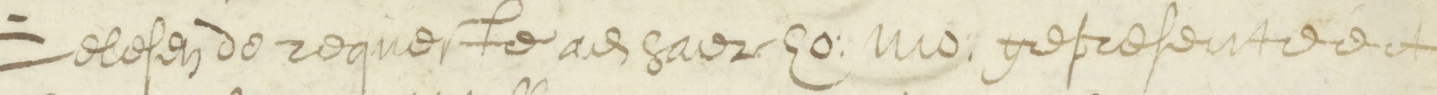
Gelesen de requeste aen haer ho:mo: gepresenteert
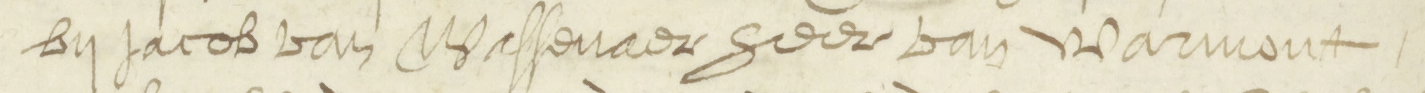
bij Jacob van Wassenaer heer van Warmont
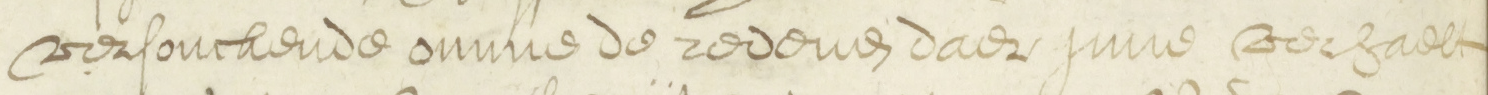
versouckende omme de redenen daer Inne verhaelt
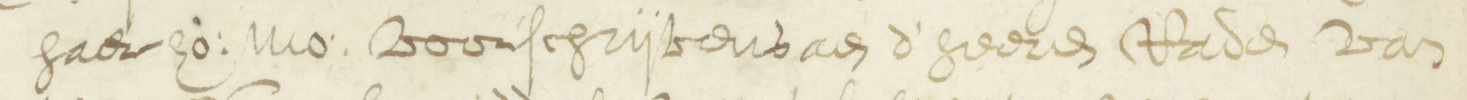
haer ho:mo: voorschrijvens aen d'heeren Raden van
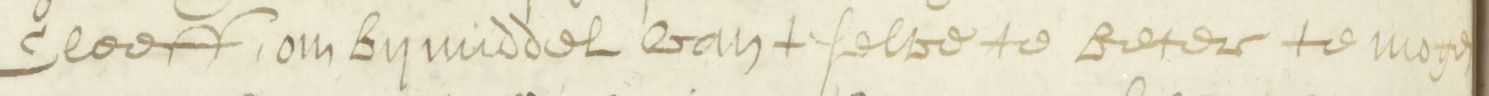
Cleeff, om by middel van t'selve te beter mogen
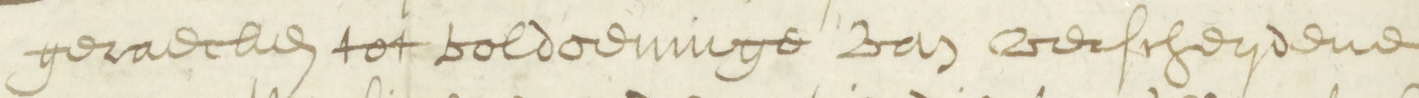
geraecken tot voldoeninge van verscheydene
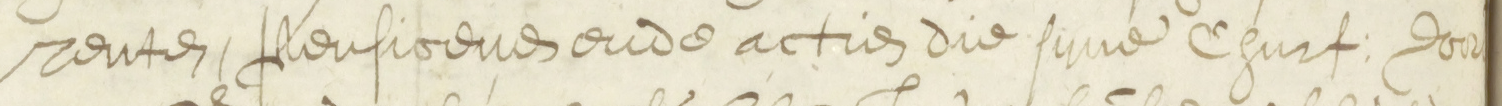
renten, pensioenen ende actien die sijne Churf: Doo
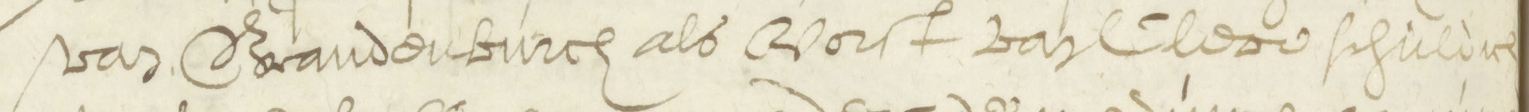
van Brandenburch als Vorst van Cleve schuldich
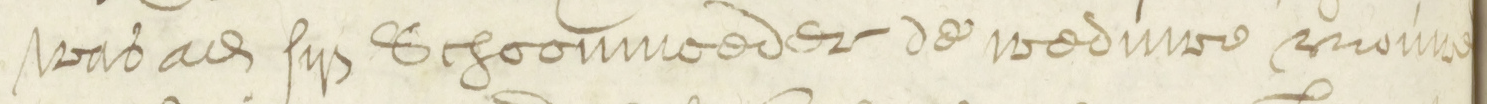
was aen syn Schoonmoeder de weduwe vrouwe
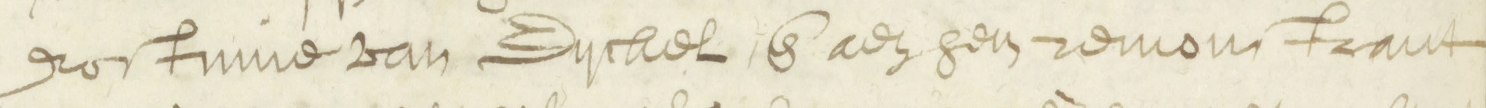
drostinne van Dyckel, & aen hem remonstrant
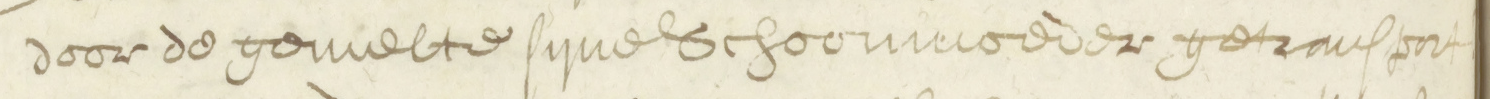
door de gemelte syne Schoonmoeder getransport
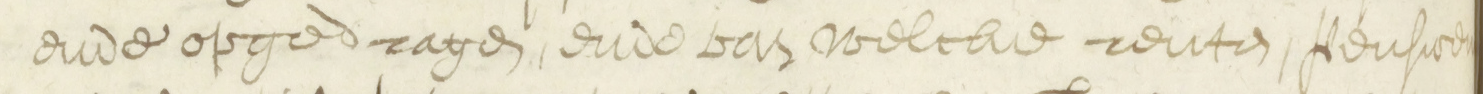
ende opgedragen, ende van welcke renten, pensioenen
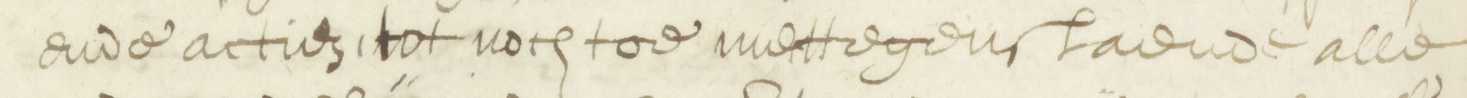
ende actien tot noch toe niettegenstaende alle
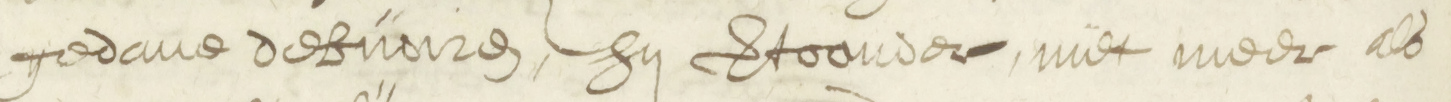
gedane debuoiren, hy vtoonder, niet meer als
